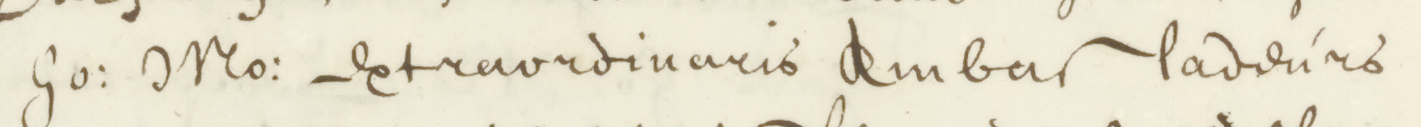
ho:Mo: extraordinaris Ambassadeurs
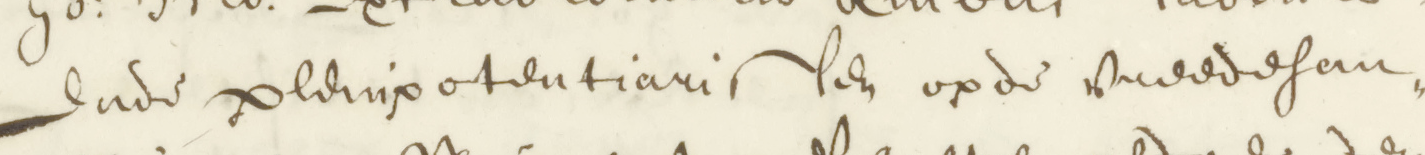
ende plenipotentiarissen opde Vreedehan„
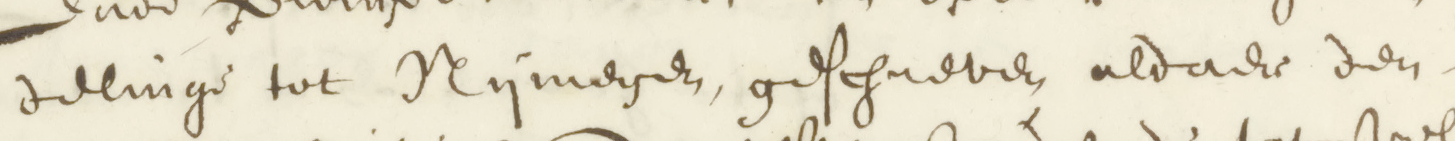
delinge tot Nijmegen, geschreven aldaer den
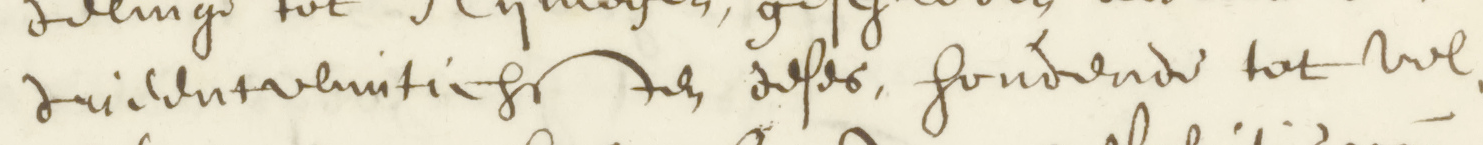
drieentwintichsten deses, houdende tot vol„
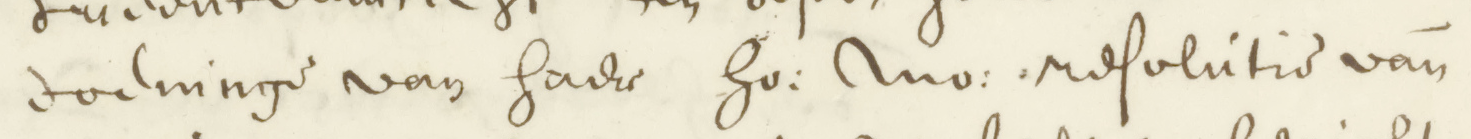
doeninge van haer ho:Mo: resolutie van
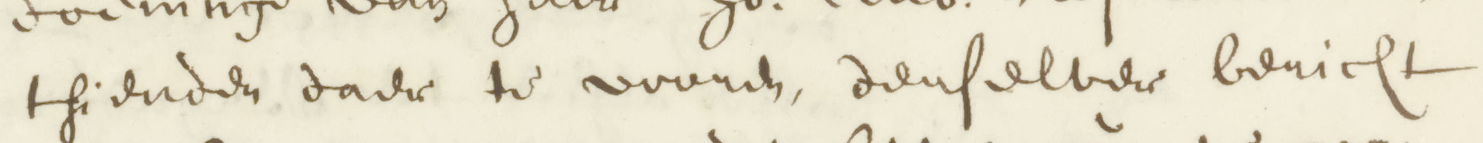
thienden daer te vooren, derselver bericht
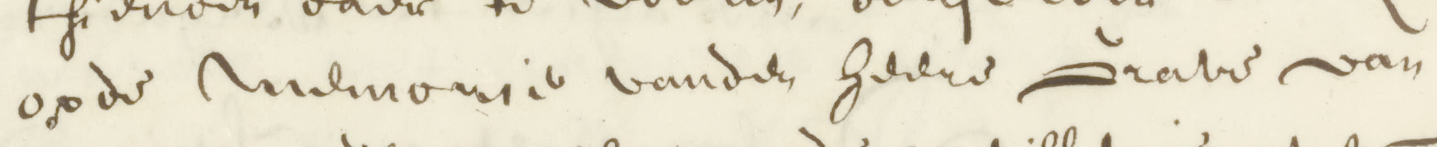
opde memorie vanden heere Grave van
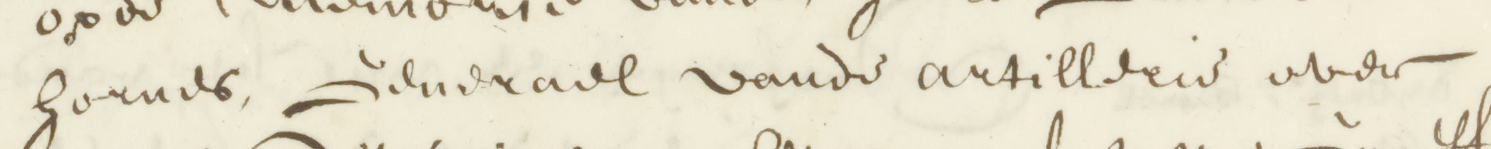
Hornes, Generael vande artillerie over
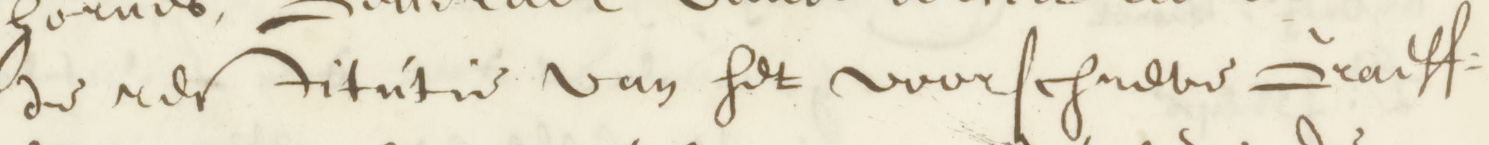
de restitutie van het voorschreve Graeff=
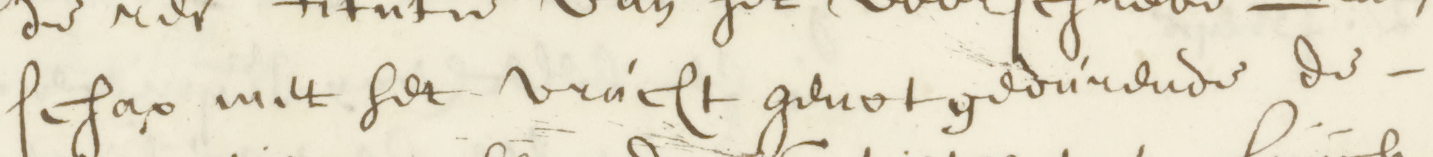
schap met het vrucht genot gedurende de -
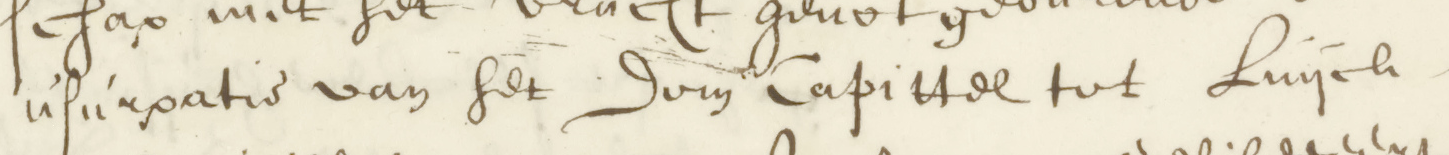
usurpatie van het Dom Capittel tot Luijck
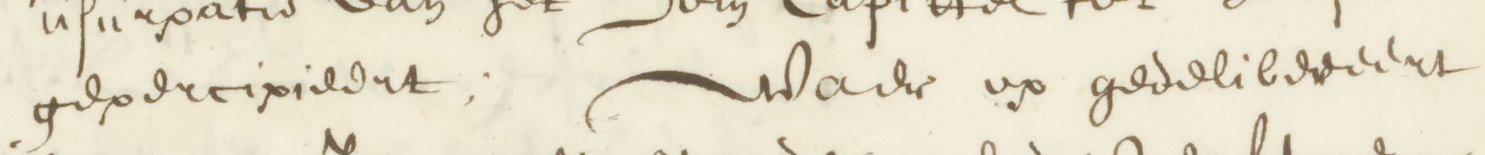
gepercipieert; Waer op gedelibereert
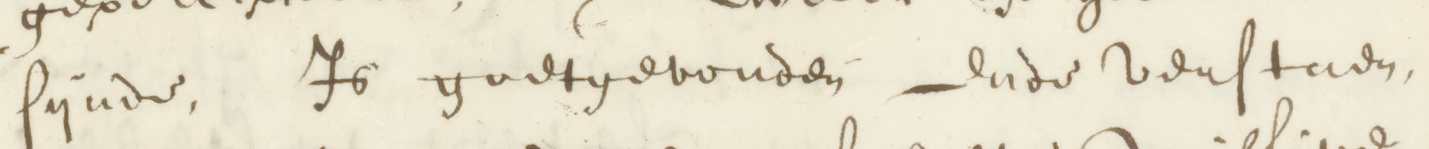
sijnde, Is goetgevonden ende verstaen,
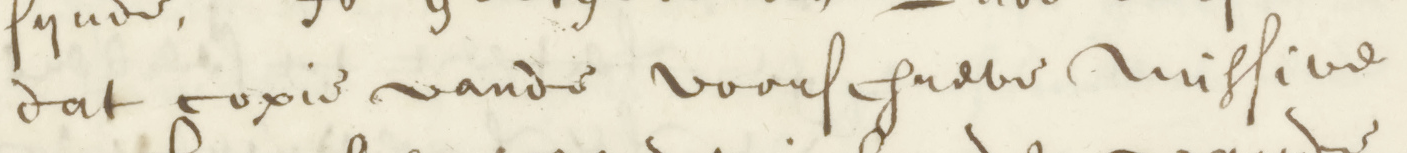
dat copie vande voorschreve missive
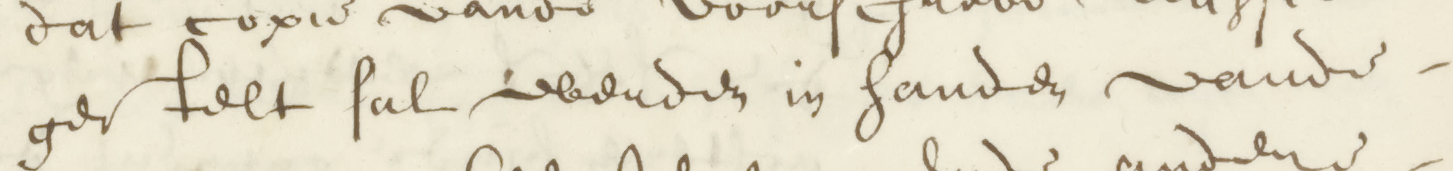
gestelt sal werden in handen vande
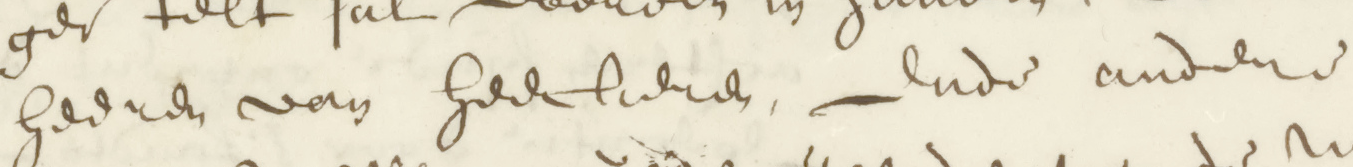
heeren van heeckeren, ende andere
